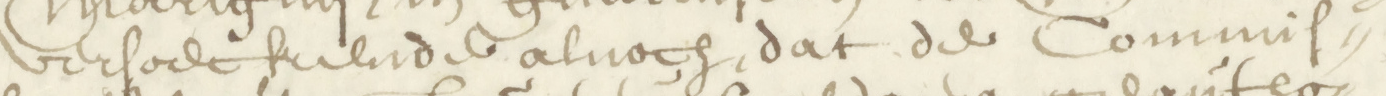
versoeckende alnoch, dat de Commis„
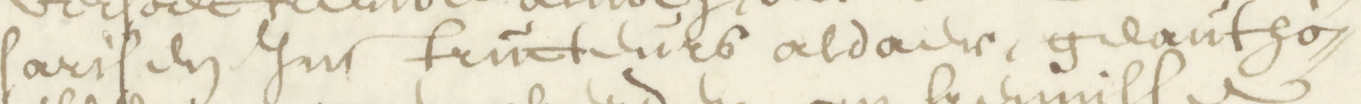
sarisen instructeurs aldaer, geautho,,
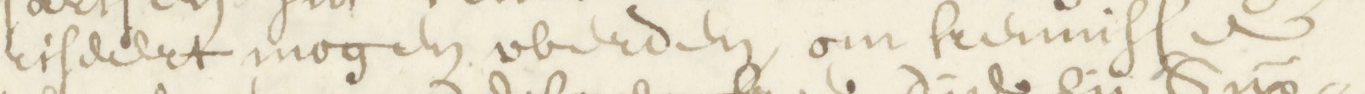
riseert mogen werden, om kennisse
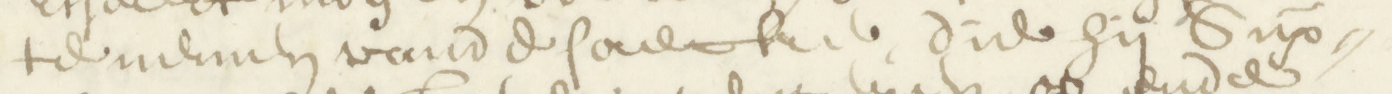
te nemen vande saecke, die hij Sup„
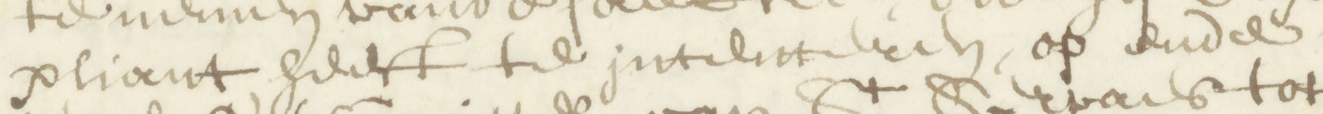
pliant heeft te intenteren, op ende
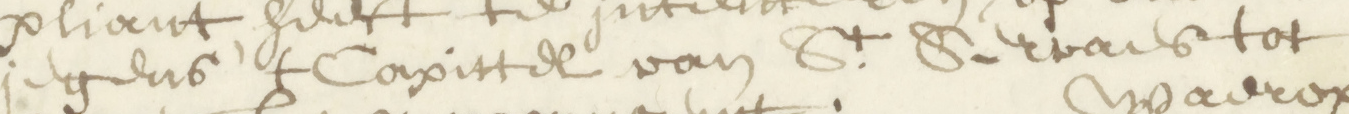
jegens 't Capittel van St. Servaes tot
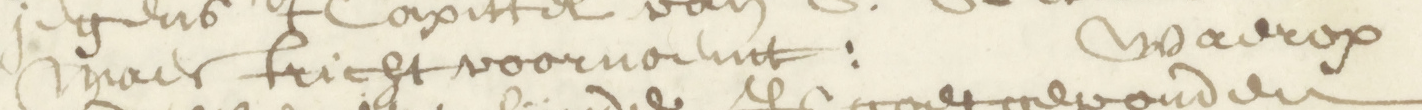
Maestricht voornoemt: Waerop
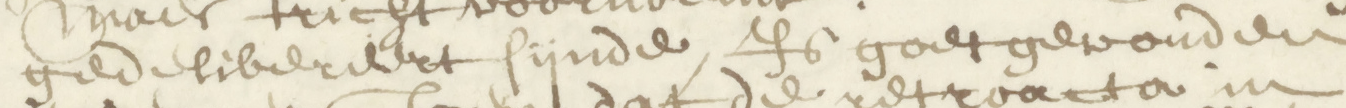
gedelibereert sijnde, is goetgevonden
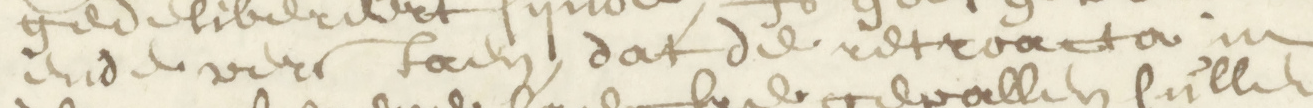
ende verstaen, dat de retroacta in
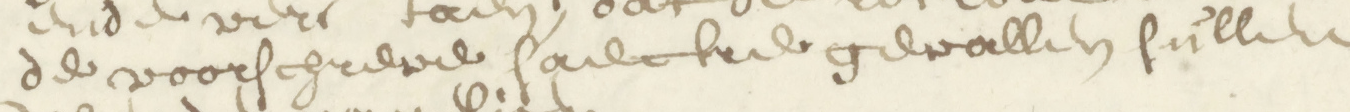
de voorschreve saecke gevallen sullen
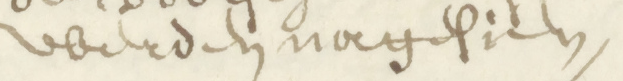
werden nagesien.
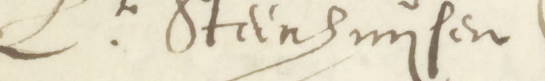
Lt. Steenhuijsen
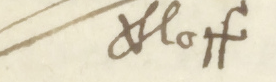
Vloff
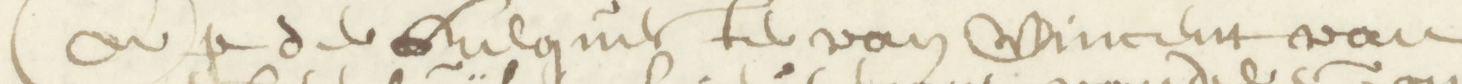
Op de requeste van Vincent van
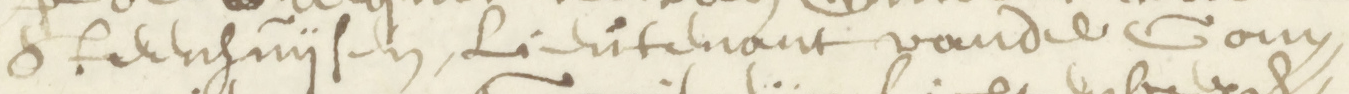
Steenhuijsen, Lieutenant vande Com„
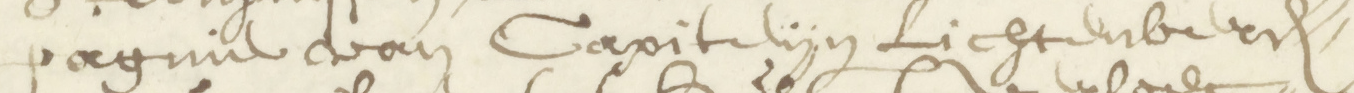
pagnie van Capiteijn Lichtenberch,
